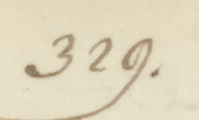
329
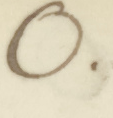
O
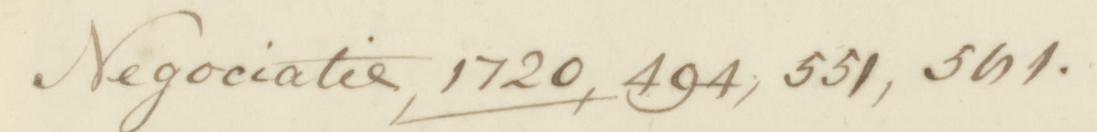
Negociatie, 1720, 494, 551, 581.
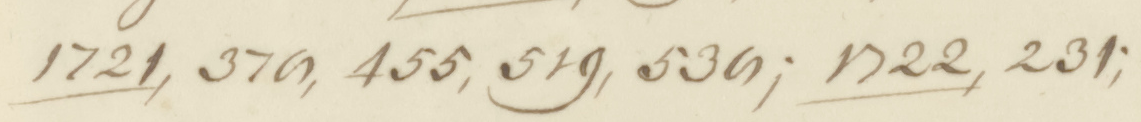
1721, 378, 455, 519, 538; 1722, 231;
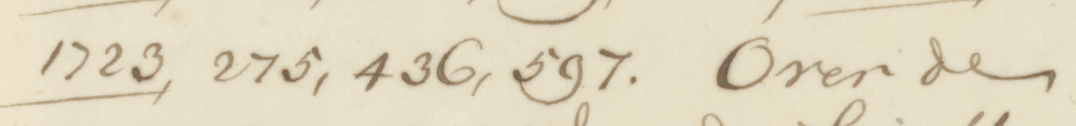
1723, 275, 436, 597. Over de
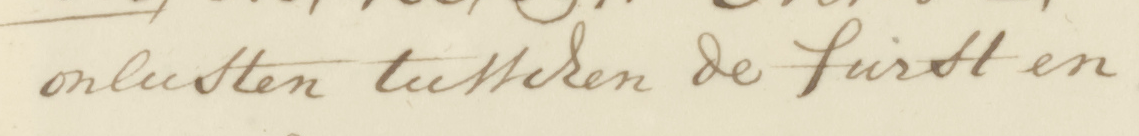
onlusten tusschen de furst en
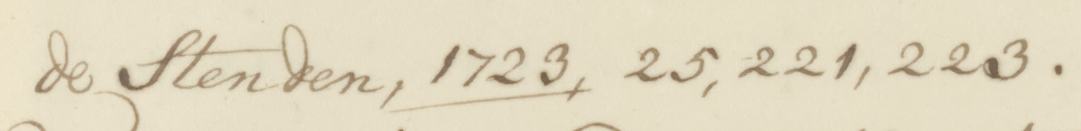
de Stenden, 1723, 25, 221, 223,
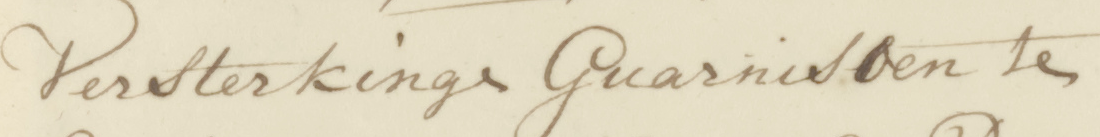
Versterkinge Guarnissoen te
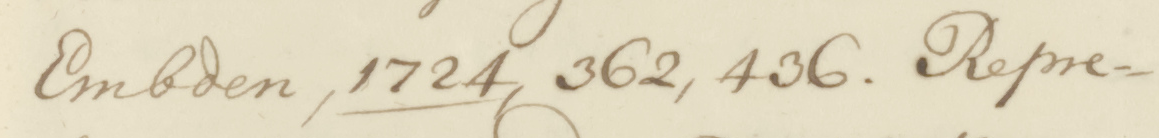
Embden, 1724, 362, 436, Repre„
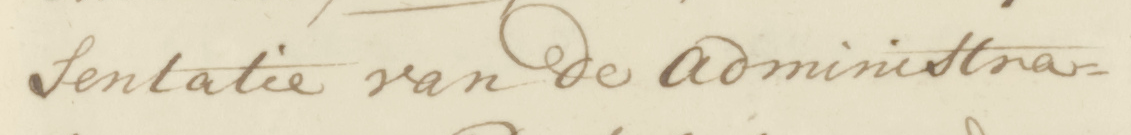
sentatie van de administra„
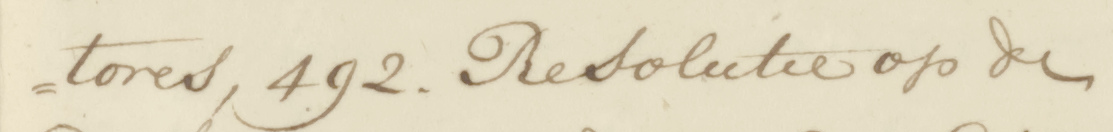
tores, 492. Resolutie op de
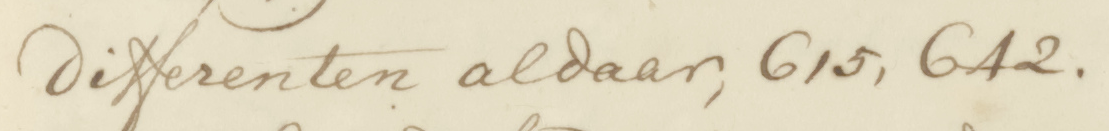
differenten aldaer, 615, 642.
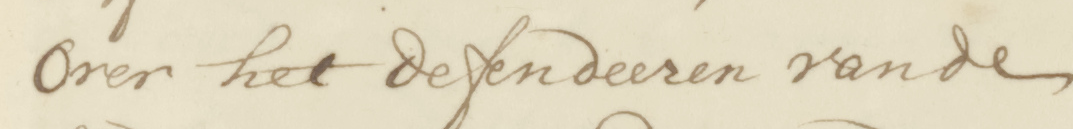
Over het defendeeren van de
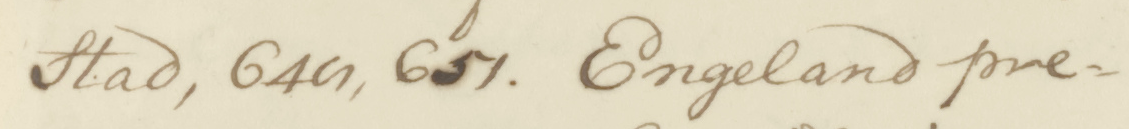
Stad, 648, 651. Engeland pre„
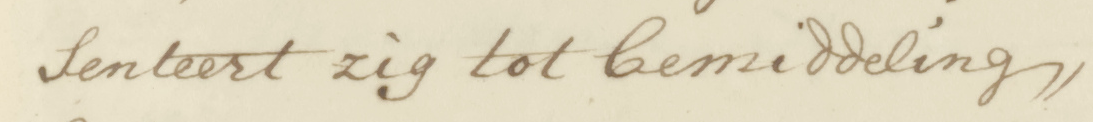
senteert zig tot bemiddeling,
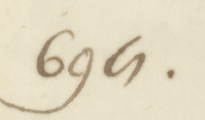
698.
